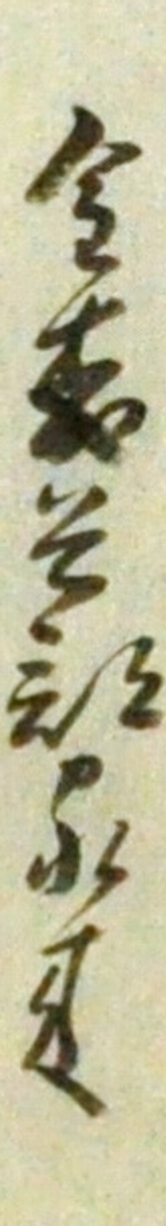金森兵部家来
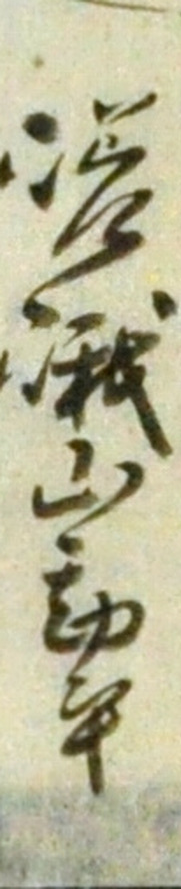嵯峨山勘平
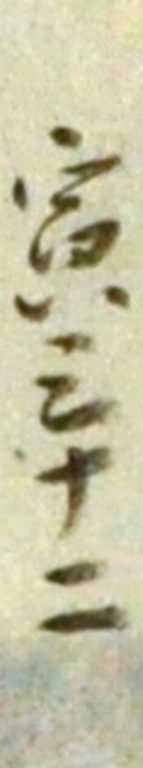寅三十二
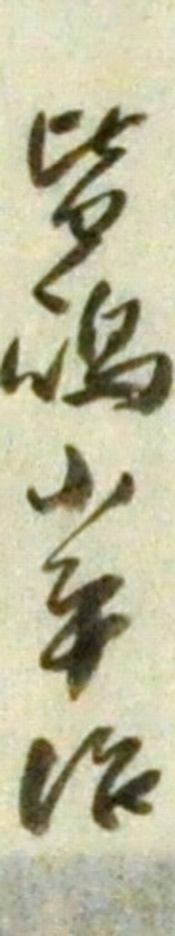皆島小平治
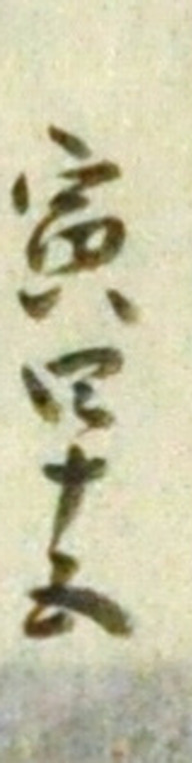寅四十五
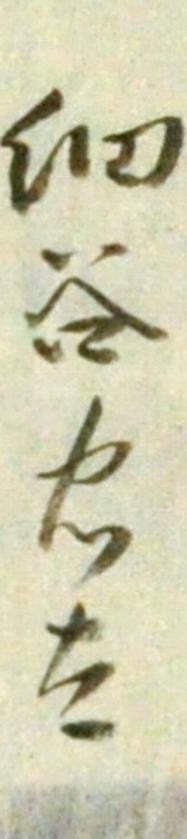細谷忠太
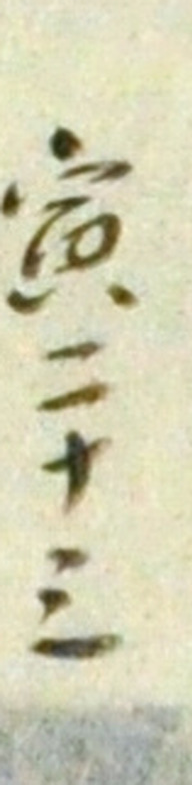寅二十三
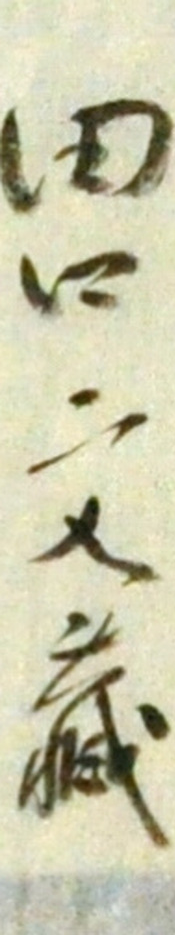田口文蔵
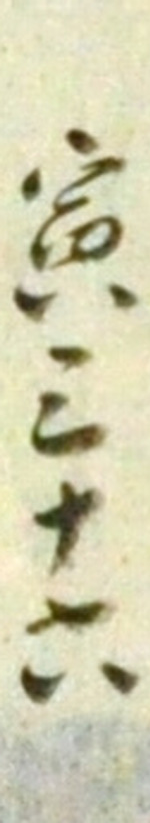寅三十六
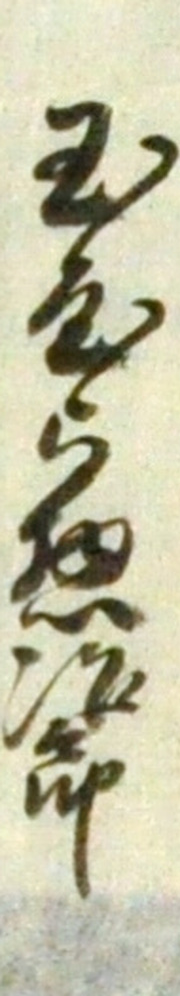玉屋与惣治郎
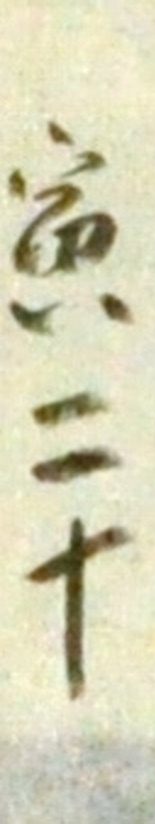寅二十
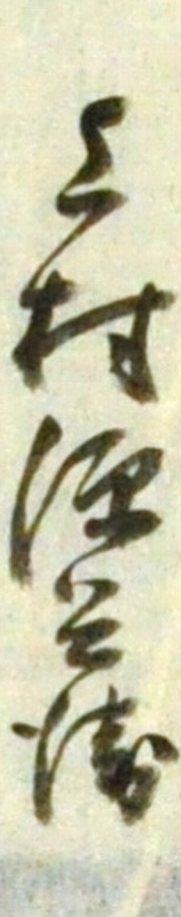上村源兵衛
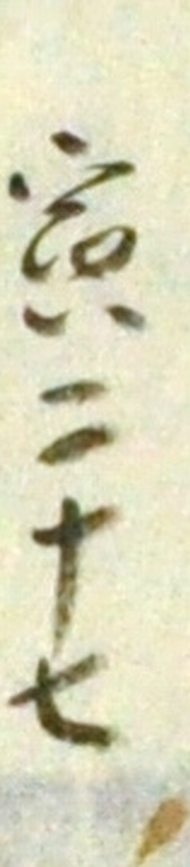寅二十七
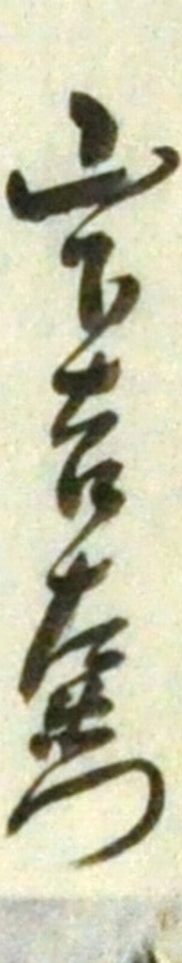山下吉左衛門
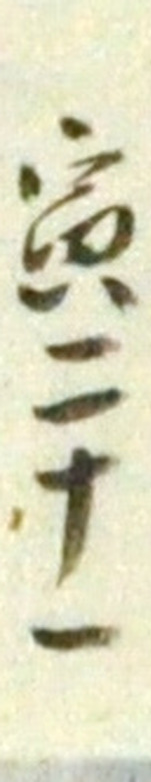寅二十一
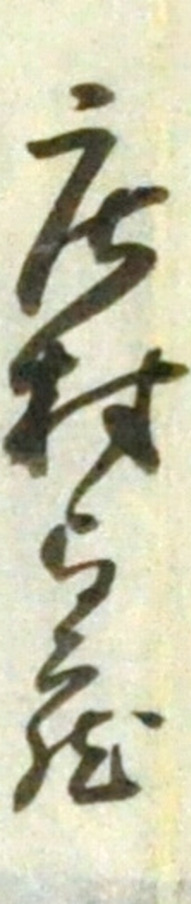庄村与蔵
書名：罪状判決
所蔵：伊那市立高遠町図書館・合同会社AMANE
